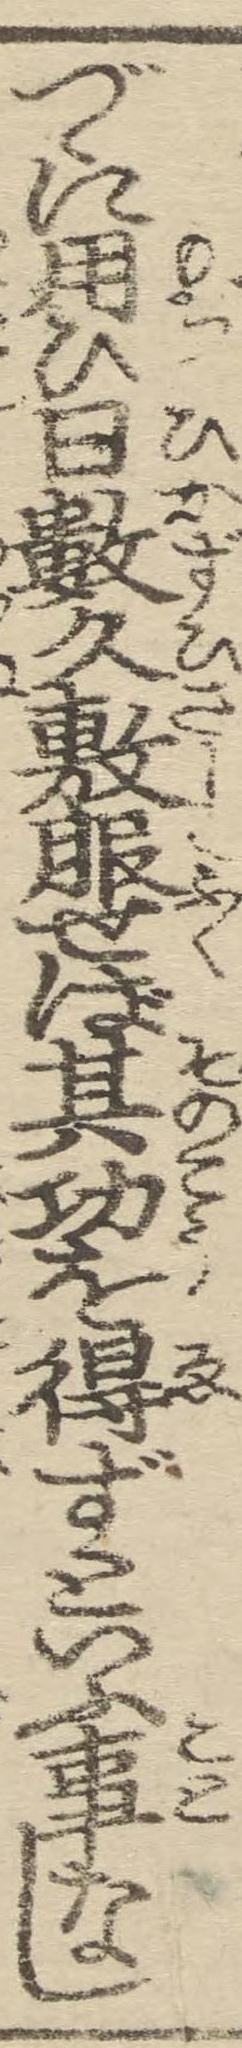づゝに用ひ日数久敷服せば其功を得といふ事なし
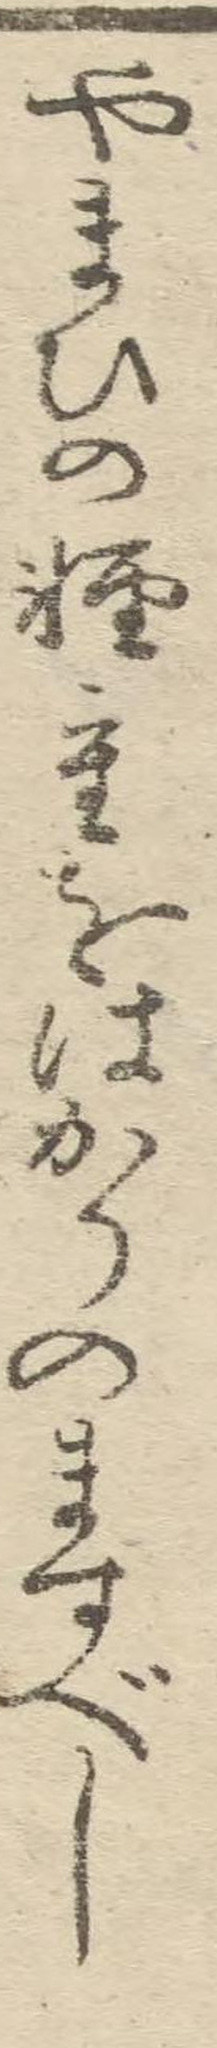やまひの軽重をはかりのますべし
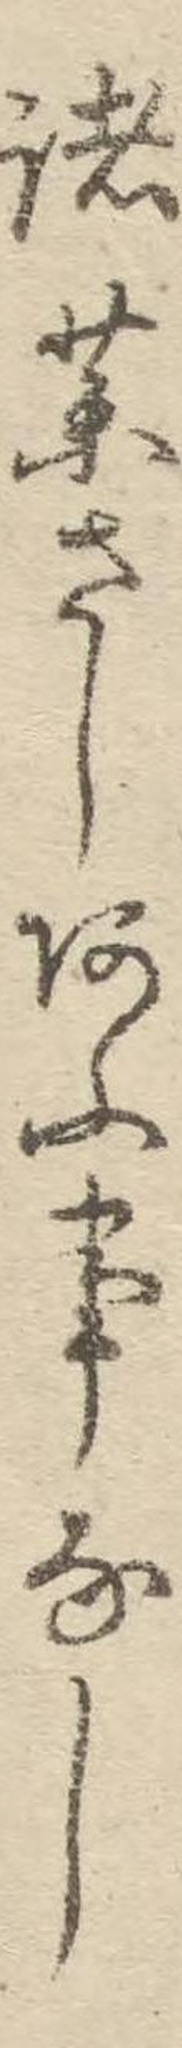諸薬さしあふ事なし
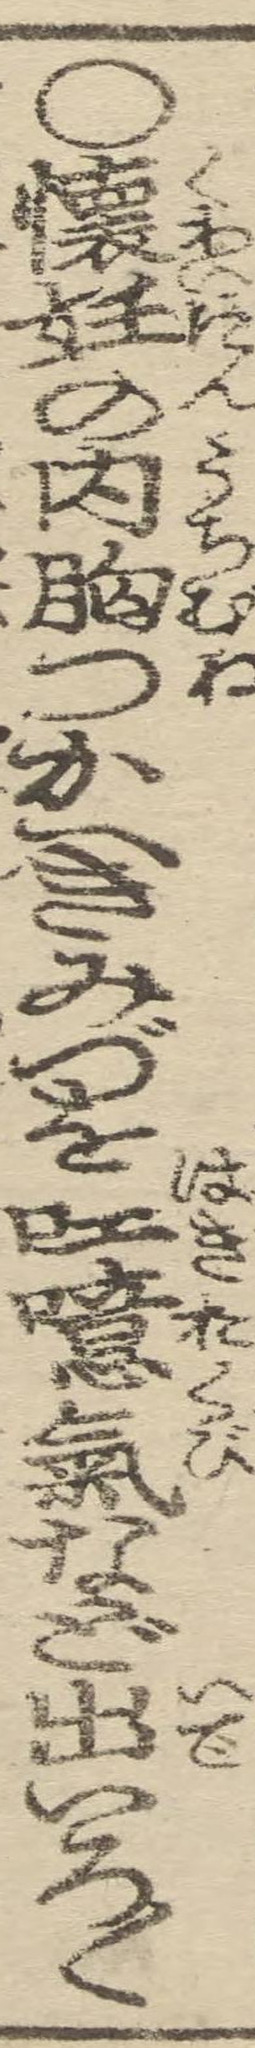○懐妊の内胸つかへきみづを吐噫気など出いろ〳〵
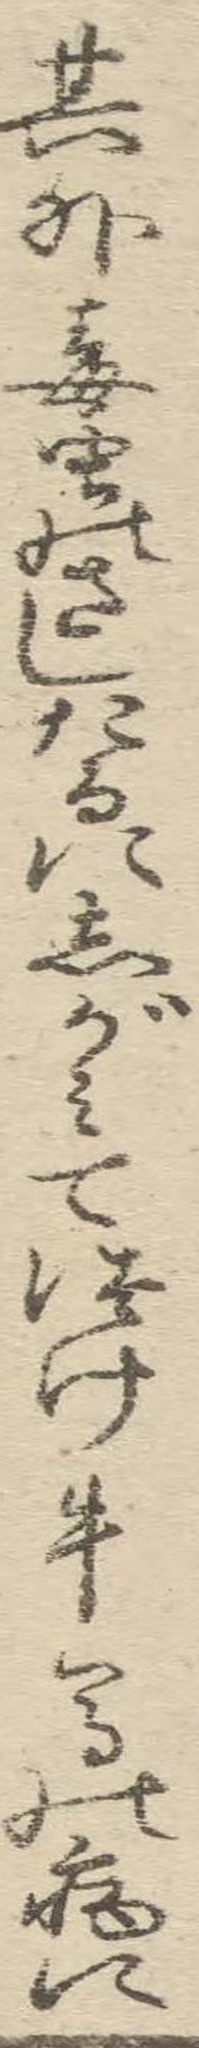其外毒虫のさしたるにしがみてつけ牛馬の病に
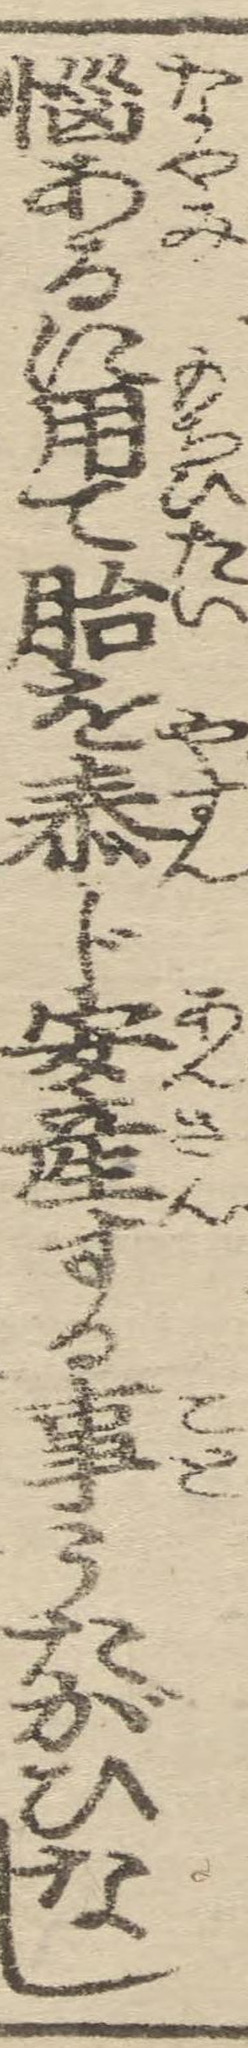悩あるに用て胎を泰じ安産する事うたがひなし
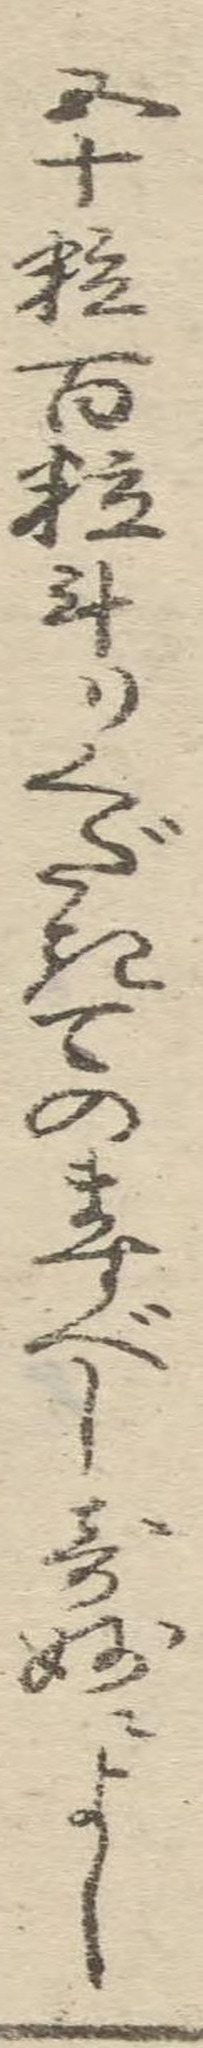五十粒百粒計りくだきてのますべし奇妙ニよし
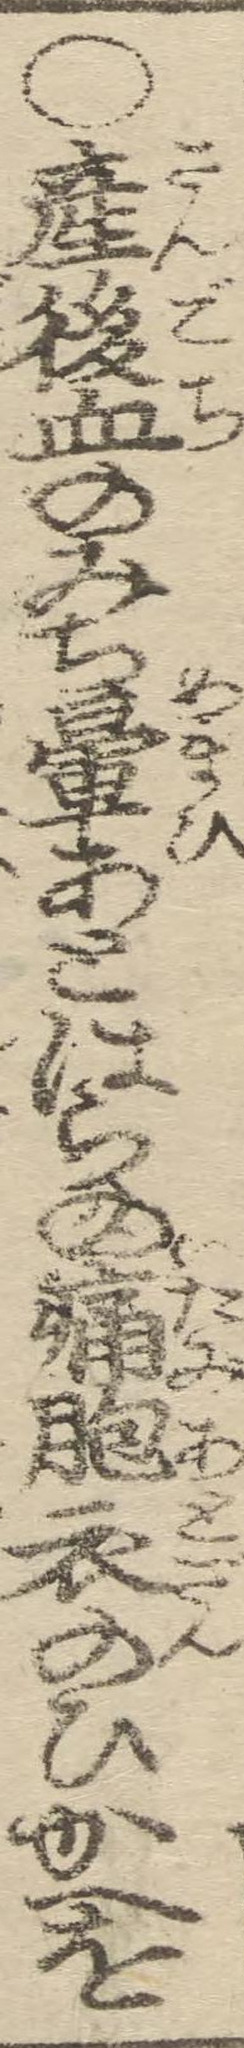○産後血のみち暈あとはらの痛胞衣のひかへを
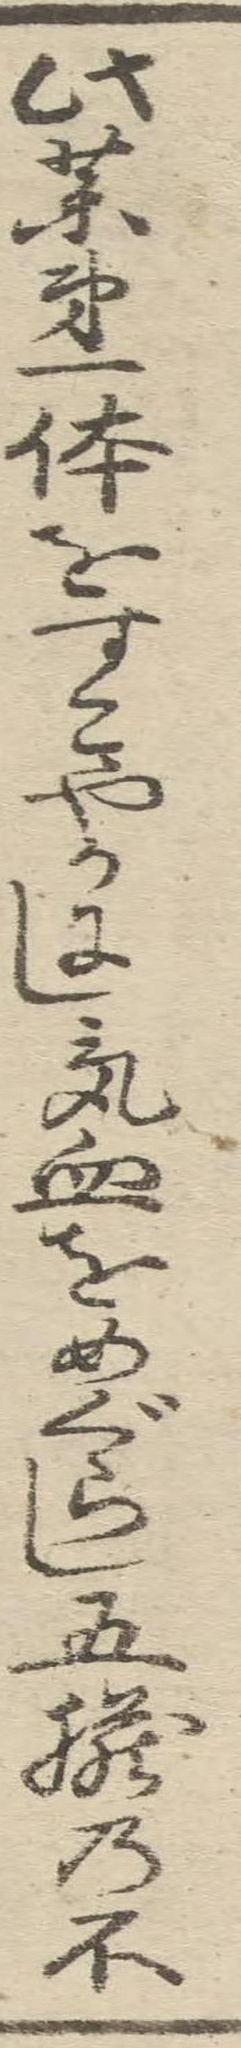此薬第一体をすこやかにし気血をめぐらし五臓の不
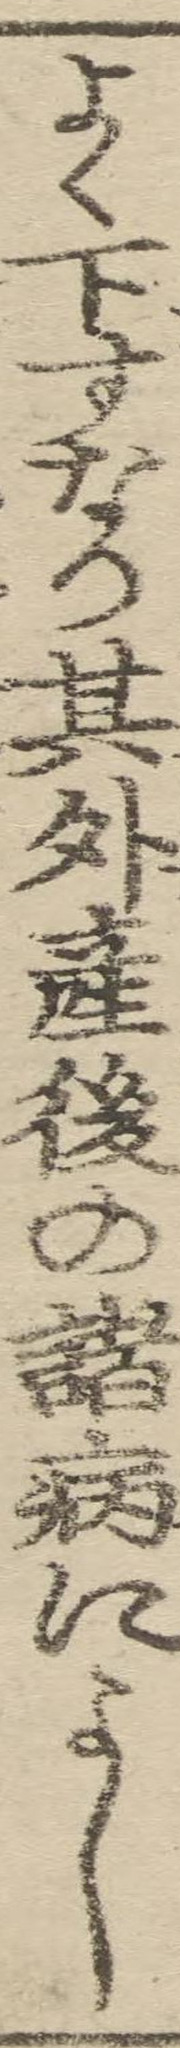よく下すなり其外産後の諸病によし
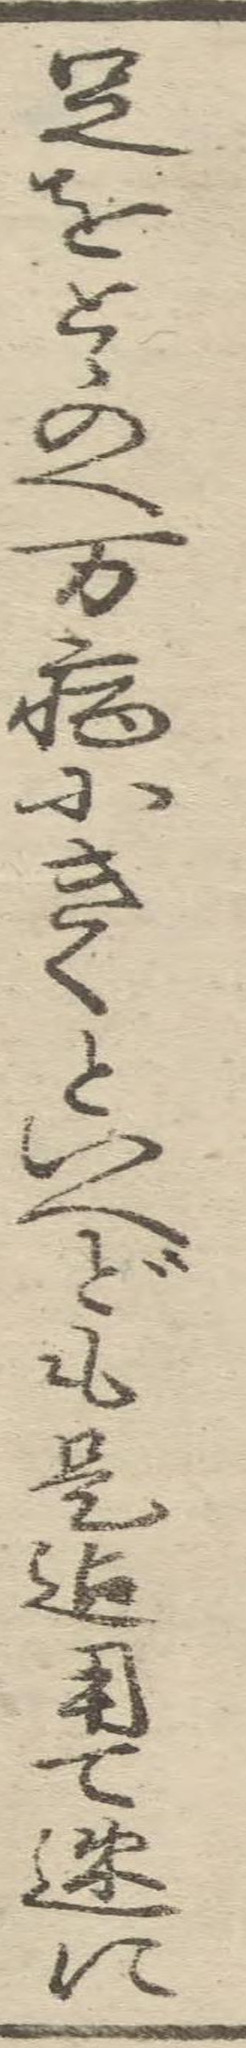足をとゝのへ万病にきくといへども是迄用て速に
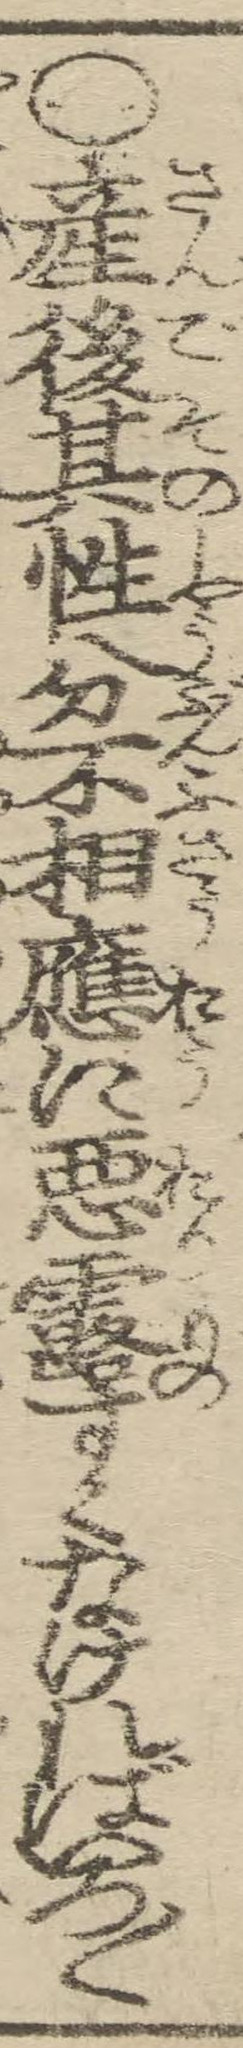○産後其性分不相応に悪露すくなければいろ〳〵
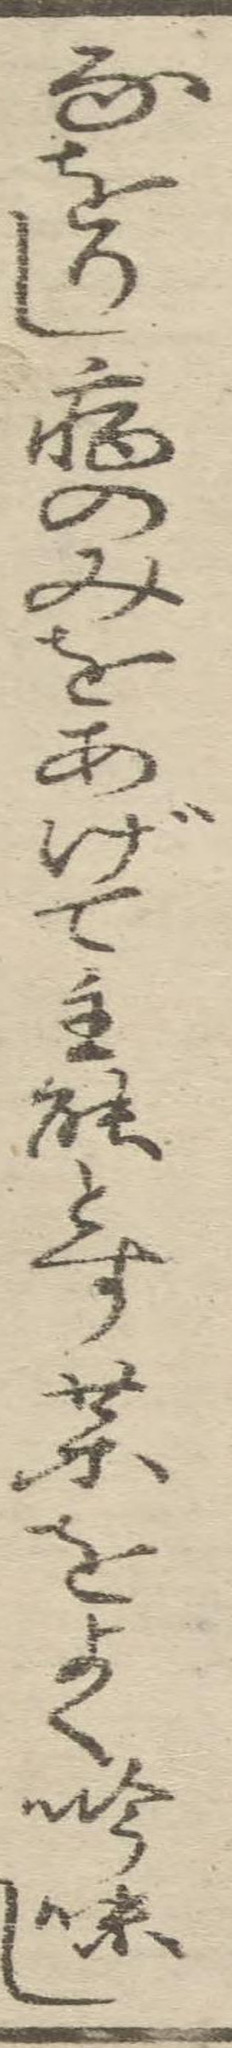なをりし病のみをあげて主能とす薬をよく吟味し
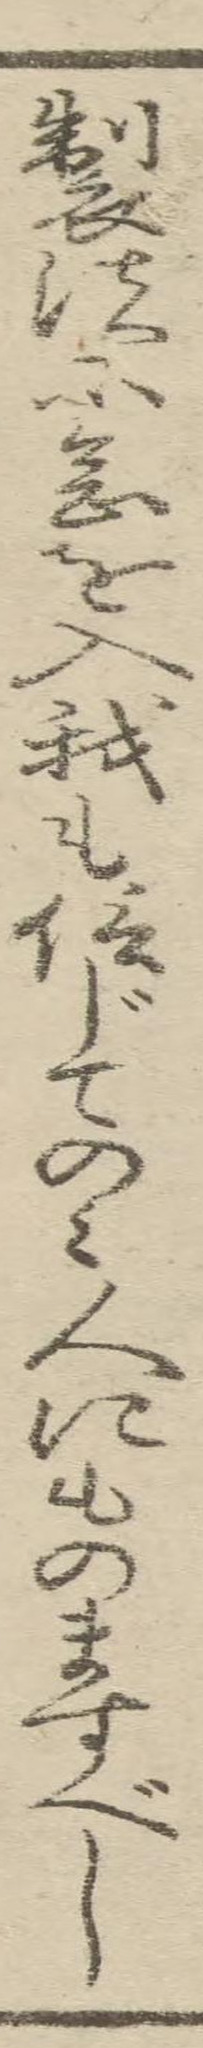製法に念を入我も信じてのみ人にものますべし
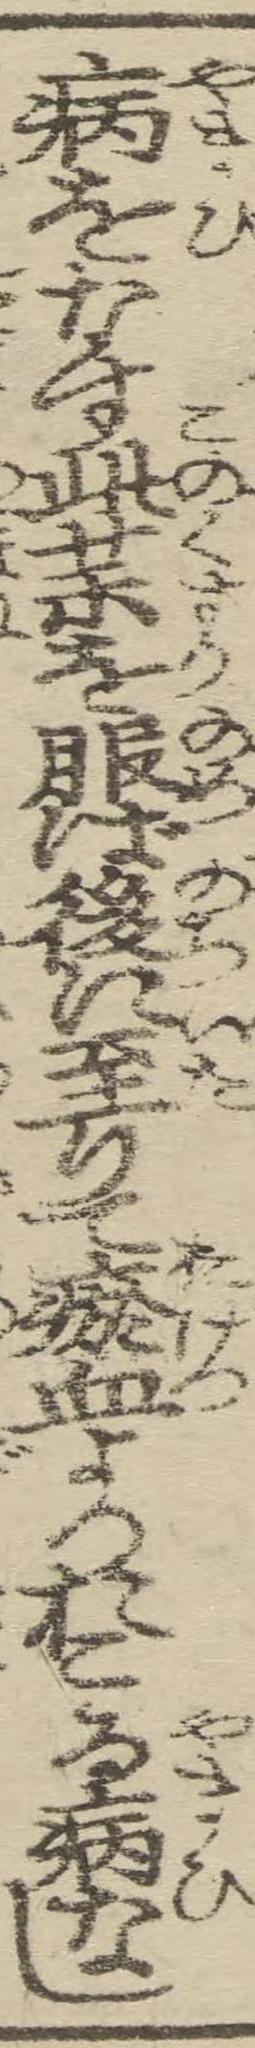病をなす此薬を服ば後に至りて瘀血よりおこる病なし
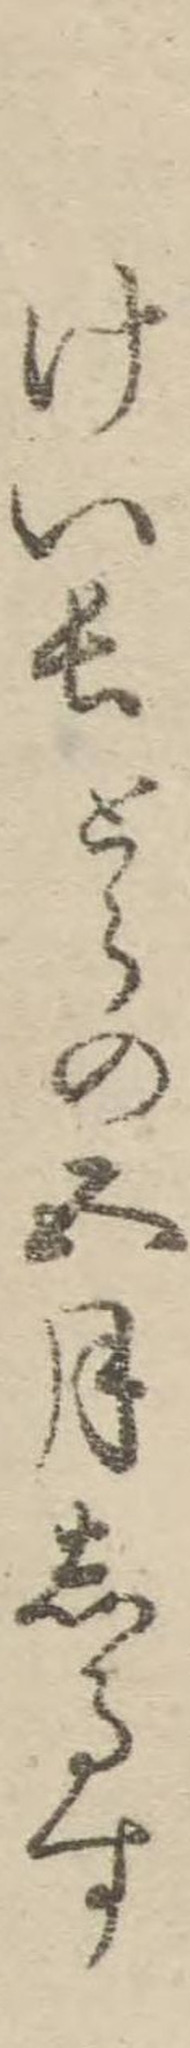けい長とらの五月しるす
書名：浪華薬種問屋能書張交帖. 二
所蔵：国立国会図書館 National Diet Library, JAPAN
